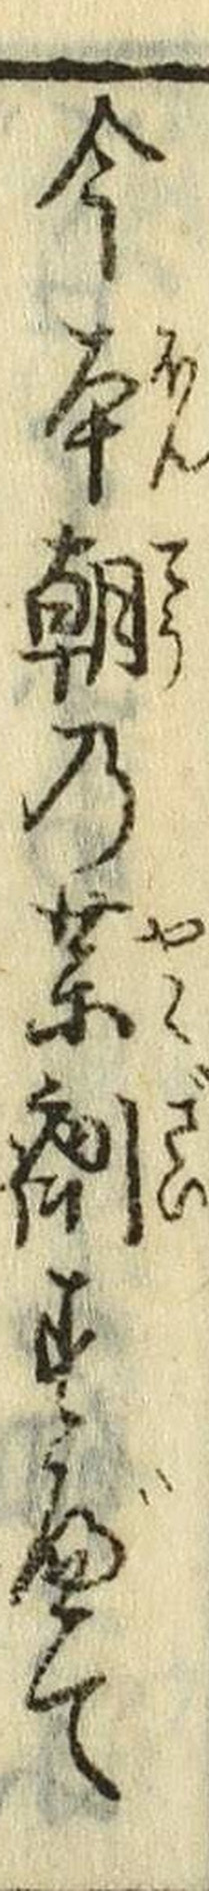今本朝の薬剤すべて
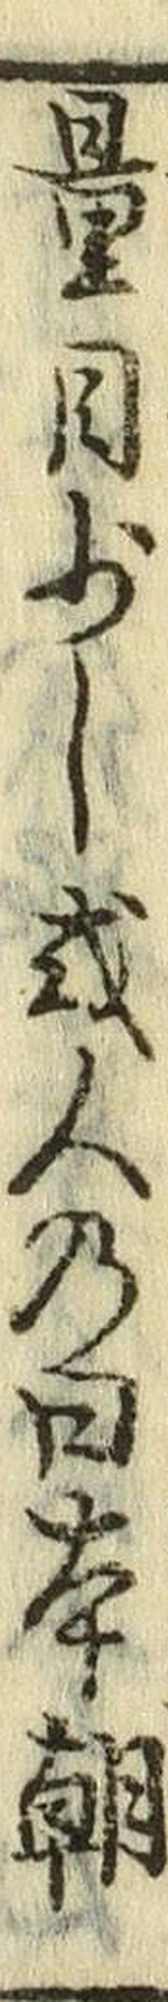量目少し或人の曰本朝
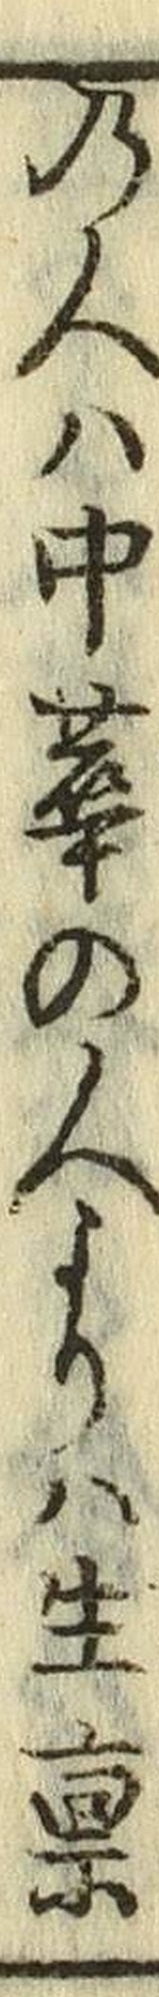の人は中華の人よりは生稟
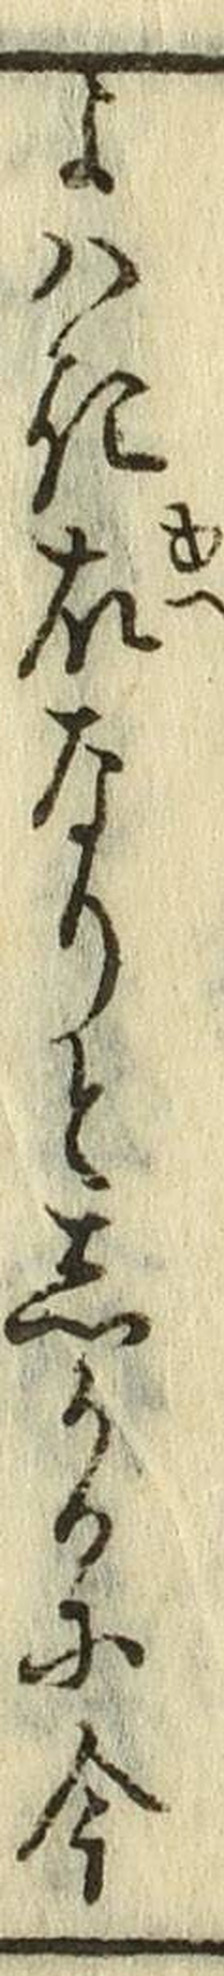よはき故なりとしかるに今
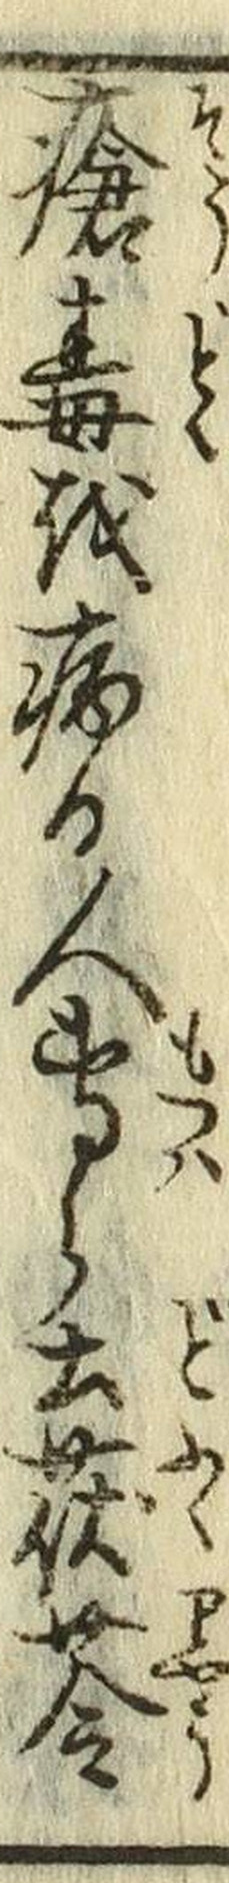瘡毒を病る人専ら土茯苓
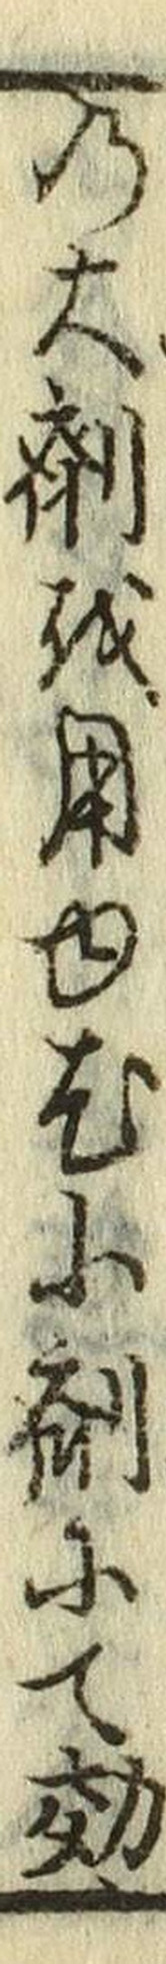の大剤を用ゆ尤小剤にて効
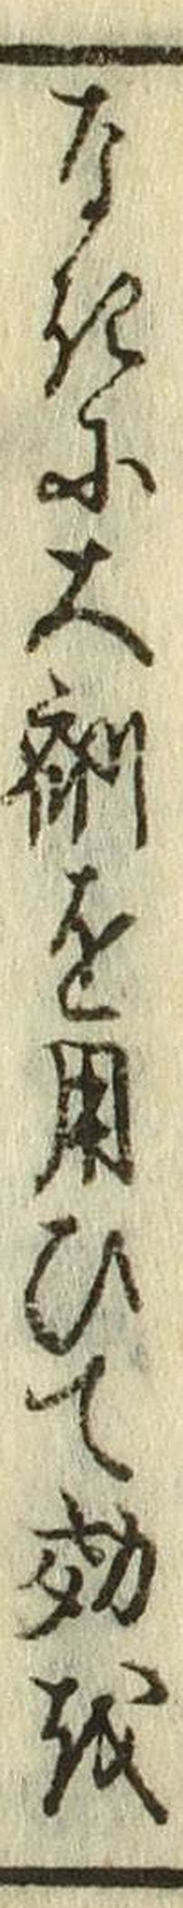なきに大剤を用ひて効を
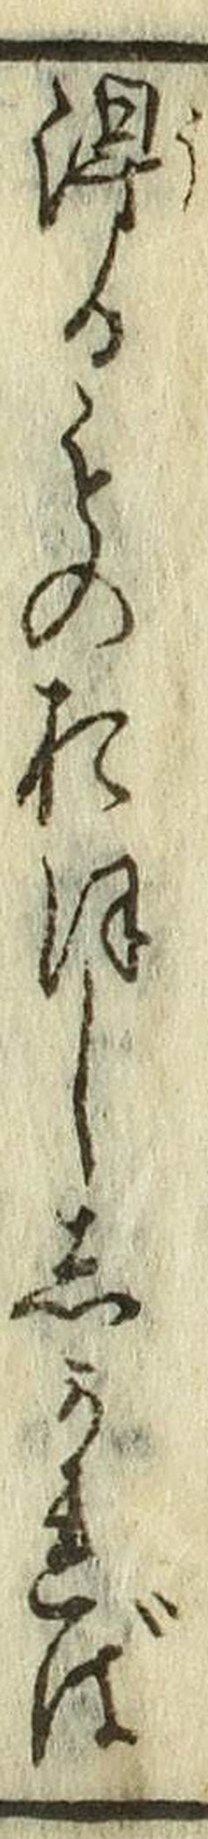得るものおほししかれば
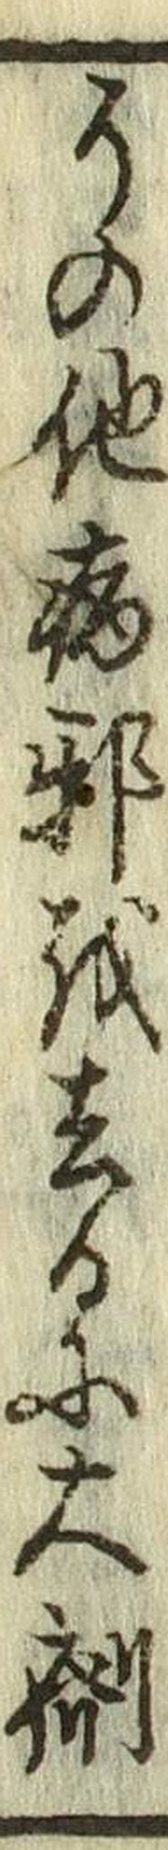その他病邪を去るに大剤
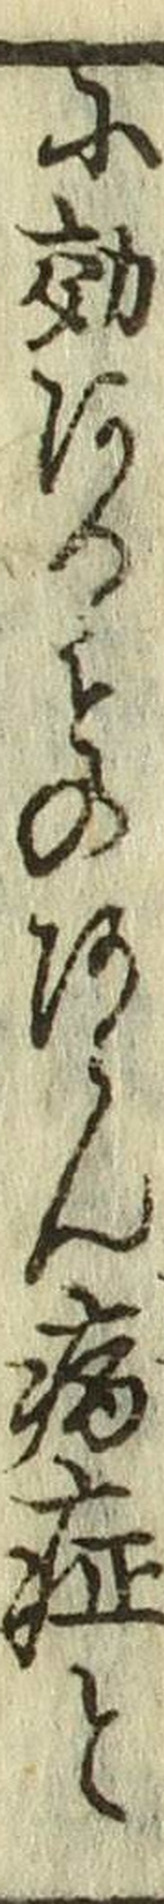に効あるものあらん病症と
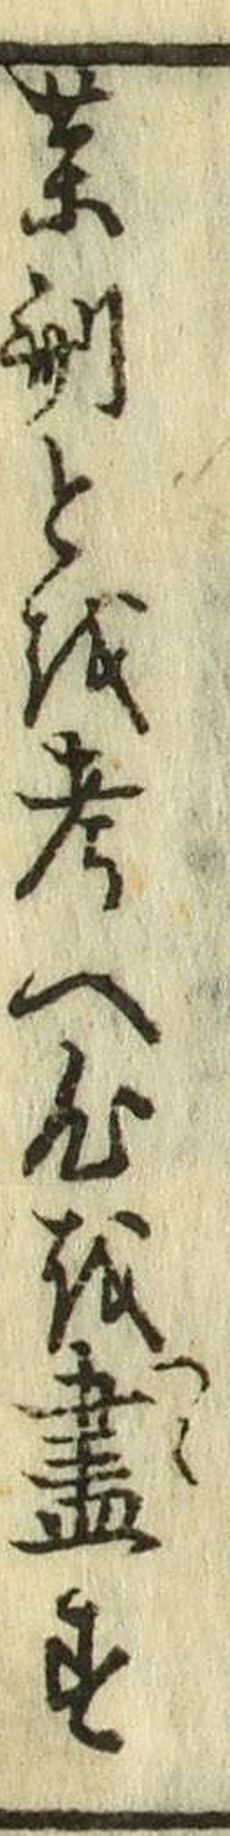薬剤とを考へ心を尽す

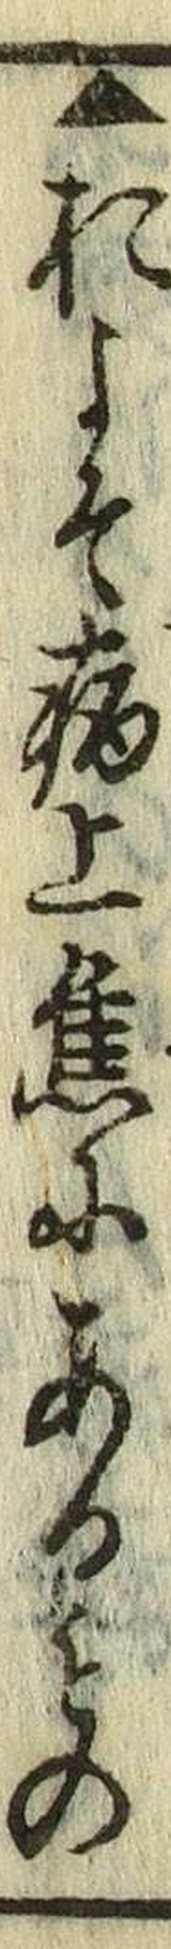▲およそ病上焦にあるもの
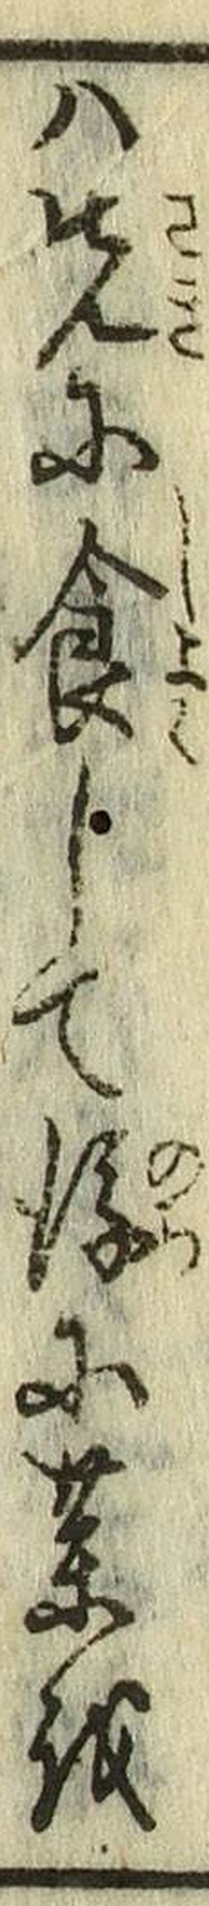は先に食して後に薬を
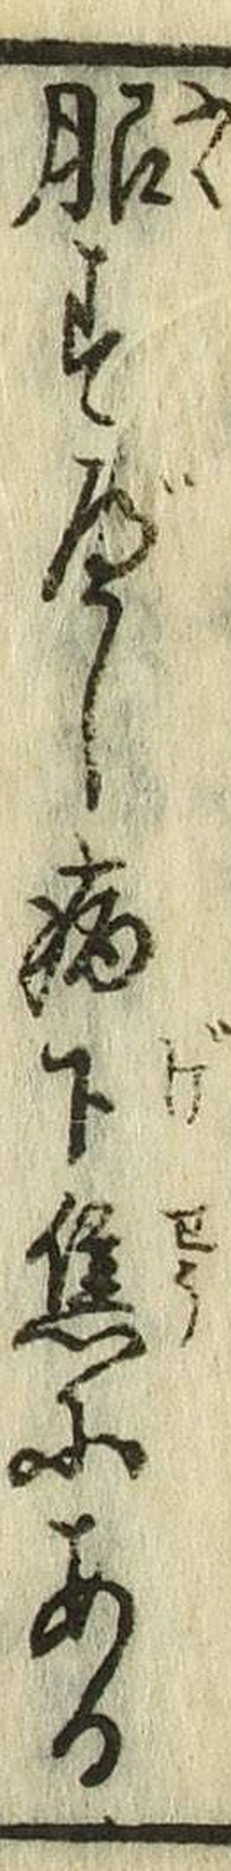服すべし病下焦にある
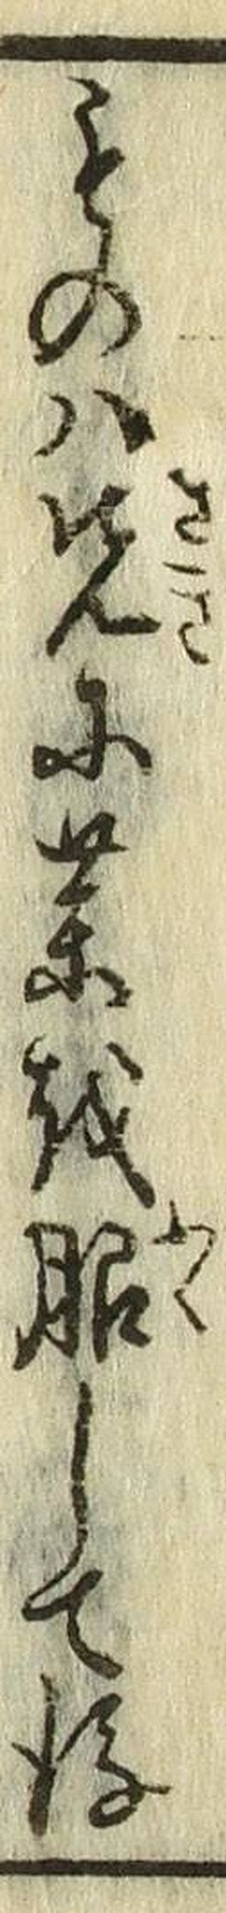ものは先に薬を服して後
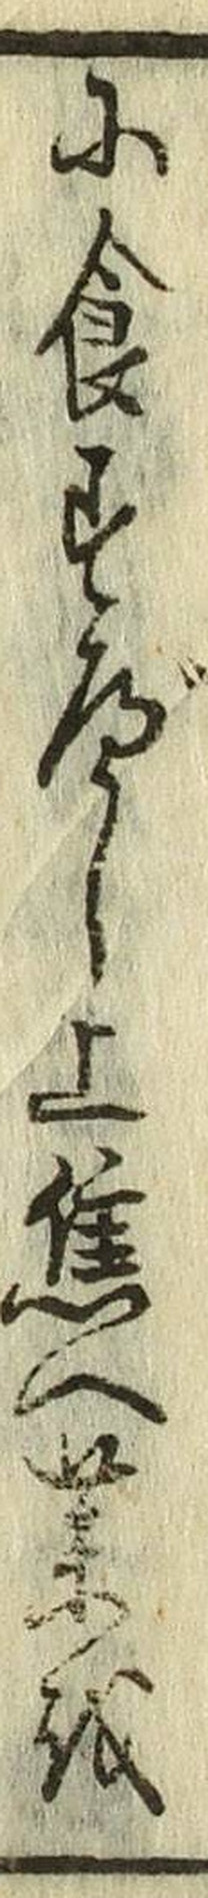に食すべし上焦へ薬を
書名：居家養生記
